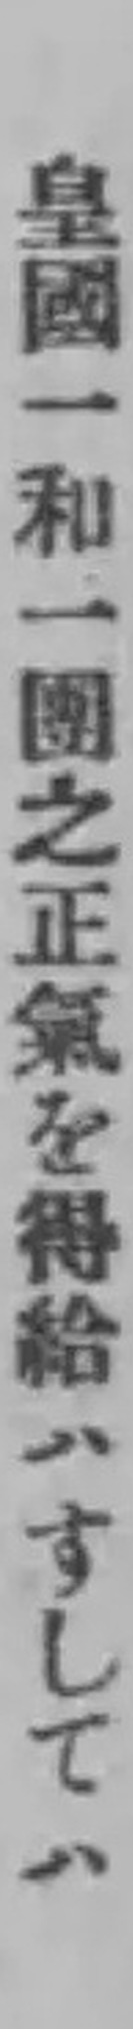皇国一和一団之正気を得給はすしては
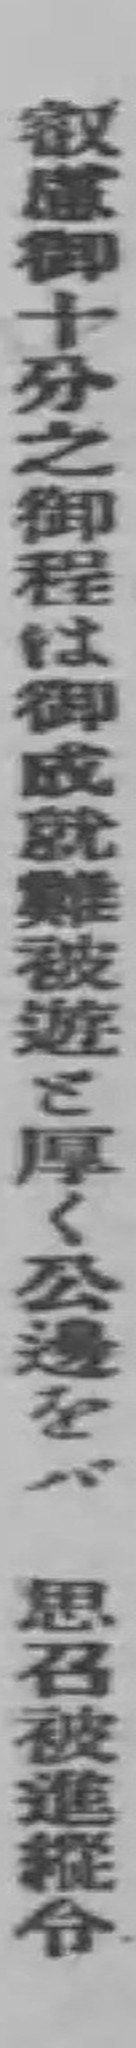叡慮御十分之御程は御成就難被遊と厚く公辺をば思召被進縦令
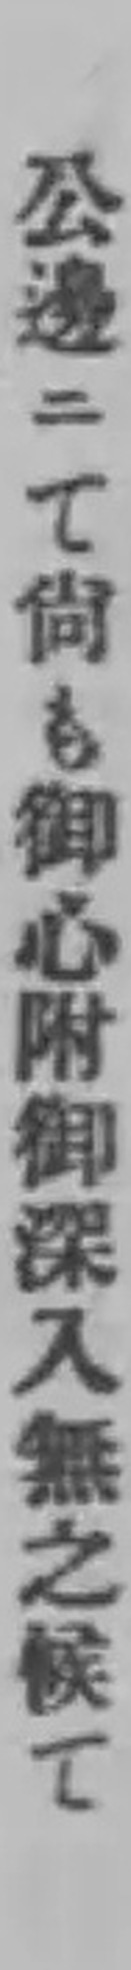公辺ニて尚も御心附御深入無之候て
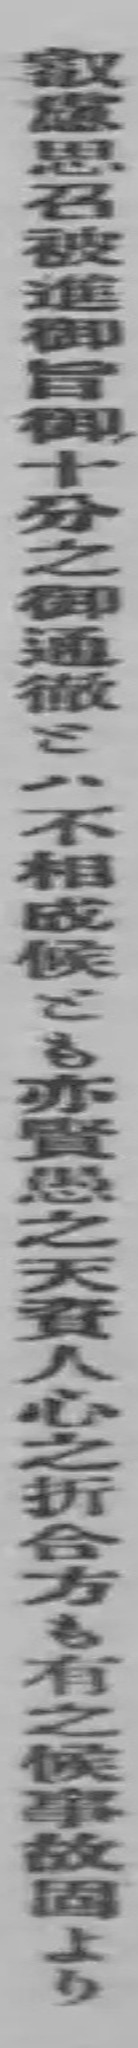叡慮思召被進御旨御十分之御通徹とは不相成候とも亦賢愚之天資人心之折合方も有之候事故固より
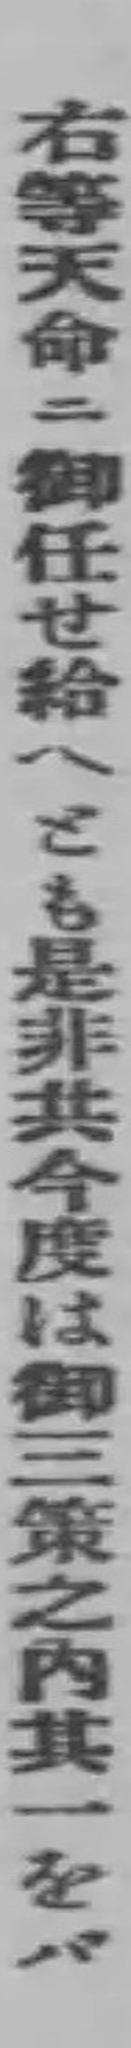右等天命ニ御任せ給へとも是非共今度は御三策之内其一をば
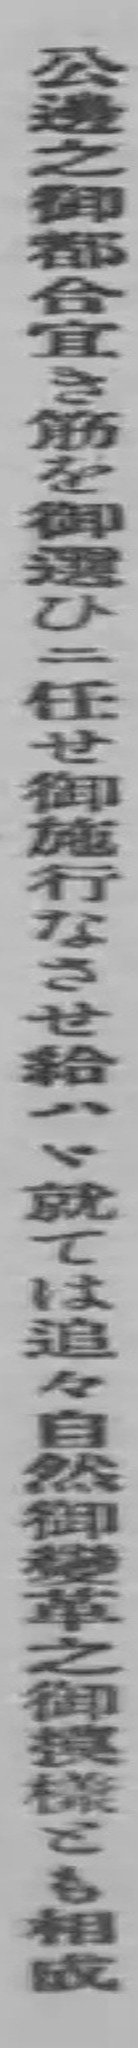公辺之御都合宜き筋を御選ひニ任せ御施行なさせ給はゞ就ては追々自然御変革之御模様とも相成
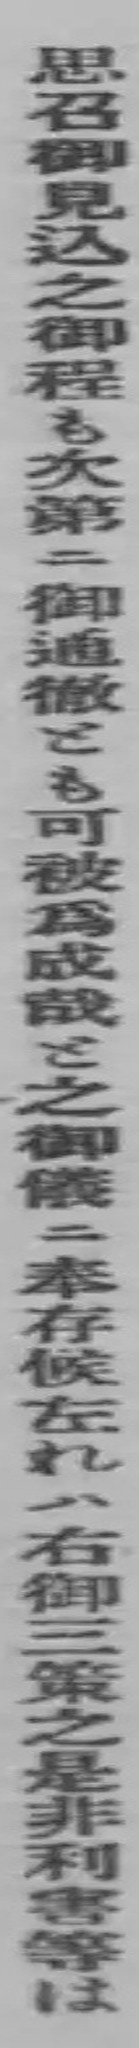思召御見込之程も次第ニ御通徹とも可被為成哉と之御儀ニ奉存候左れは右御三策之是非利害等は
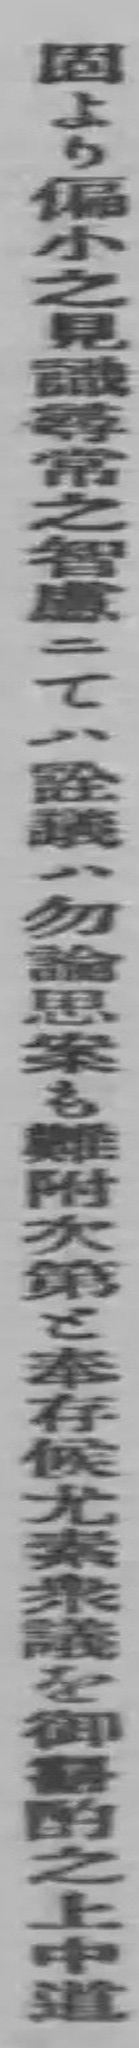固より偏小之見識尋常之智慮ニては詮議は勿論思案も難附次第と奉存候尤素衆議を御斟酌之上中道
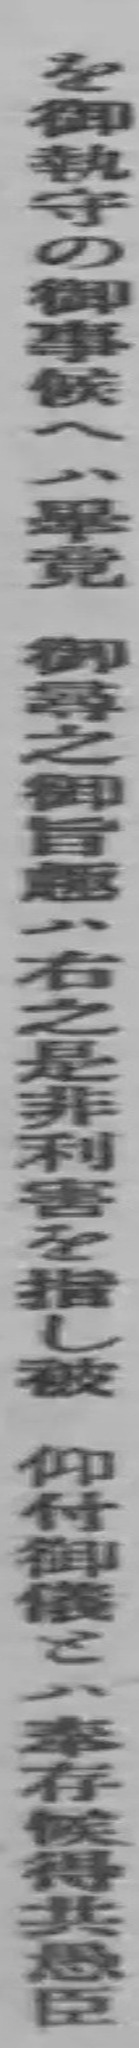を御執守の御事候へは畢竟御尋之御旨趣は右之是非利害を指し被仰付御儀とは奉存候得共愚臣

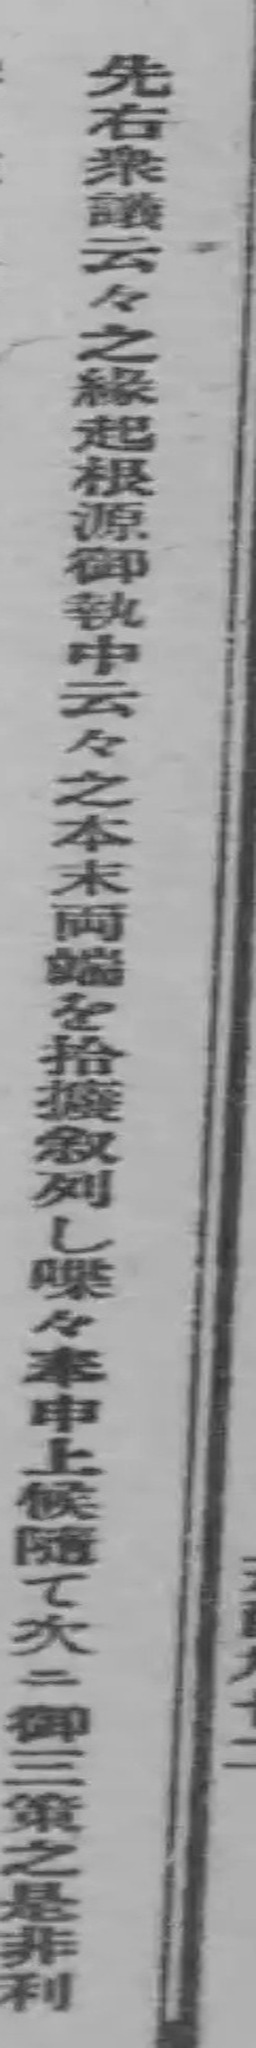先右衆議云々之縁起根源御執中云々之本来両端を拾撥叙列し喋々奉申上候随て次ニ御三策之是非利
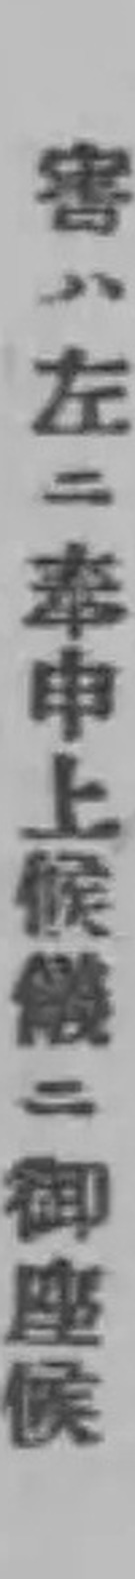害は左ニ奉申上候儀ニ御座候
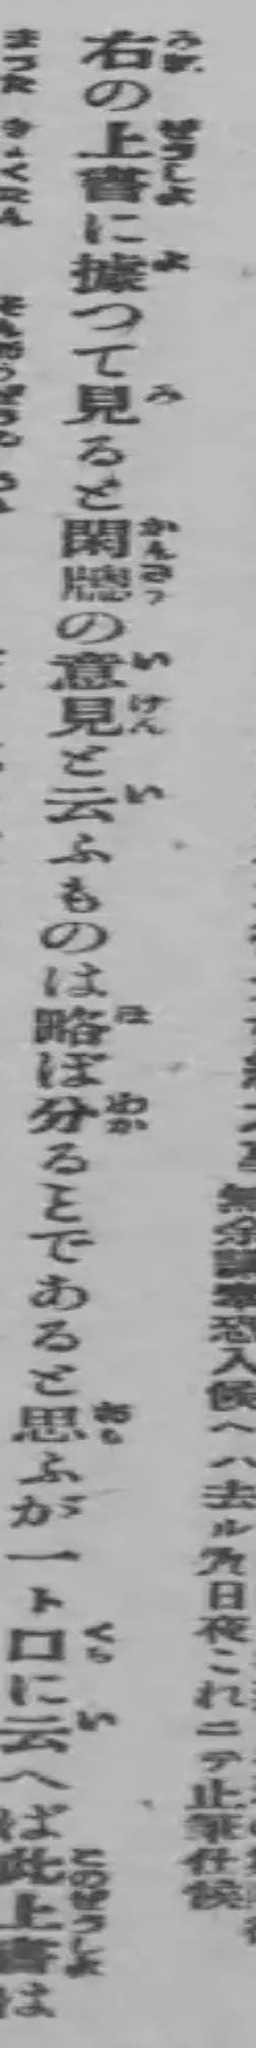右の上書に拠つて見ると閑牕の意見と云ふものは略ぼ分ることであると思ふが一ト口に云へば此上書は
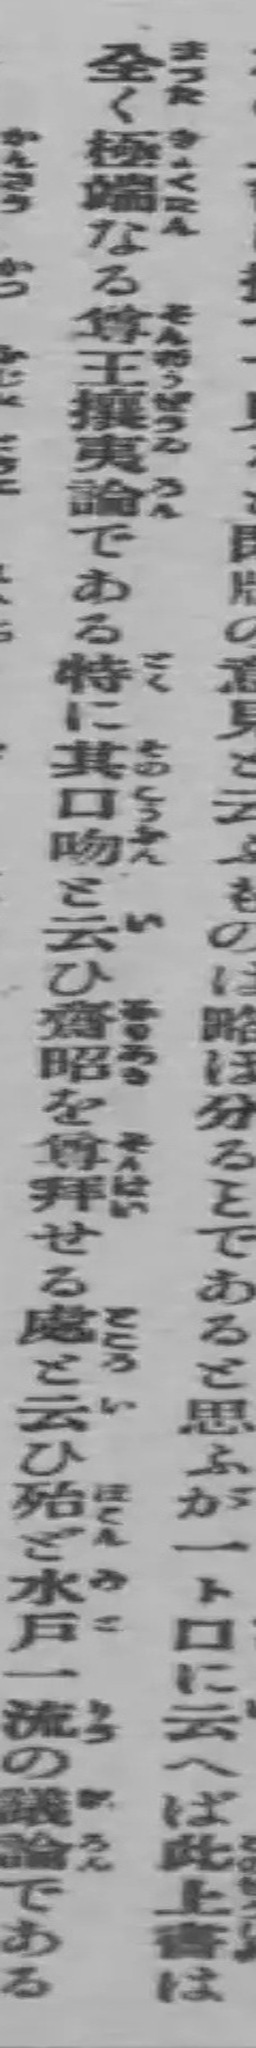全く極端なる尊王攘夷論である特に其口吻ろ云ひ斉昭を尊拝せる処と云ひ殆ど水戸一流の議論である
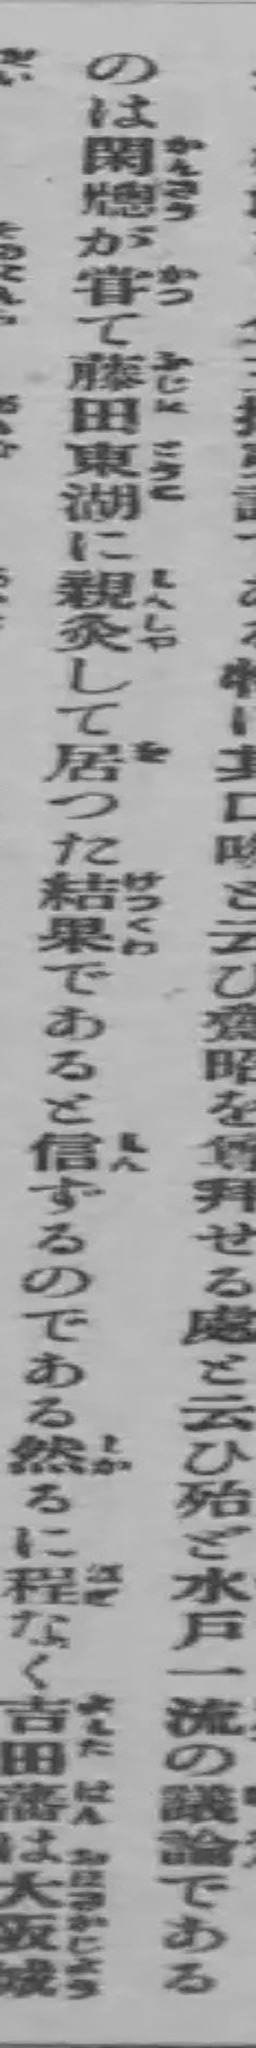のは閑牕が嘗て藤田東湖に親炙して居つた結果であると信ずるのである然るに程なく吉田藩は大阪城
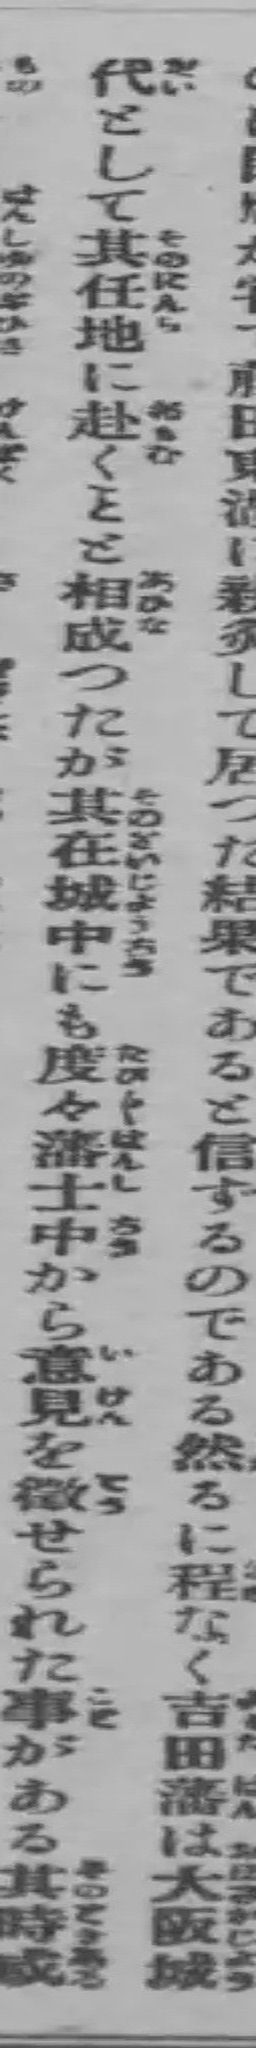代として其任地に赴くことと相成つたが其在城中にも度々藩士中から意見を徴せられた事がある其時或
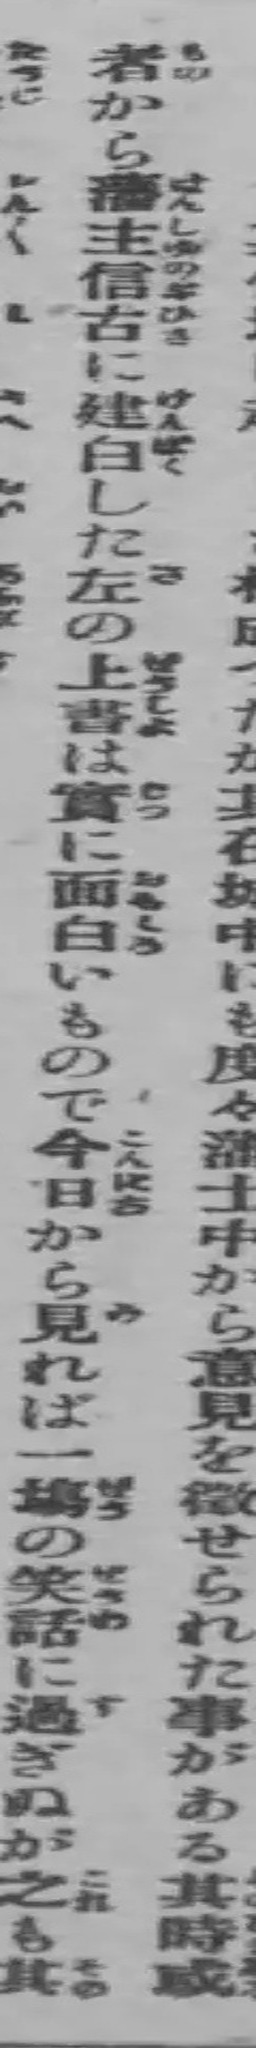者から藩主信古に建白した左の上書は実に面白いもので今日から見れば一場の笑話に過ぎぬが之も其
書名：豊橋市史談
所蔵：国立国会図書館 National Diet Library, JAPAN
